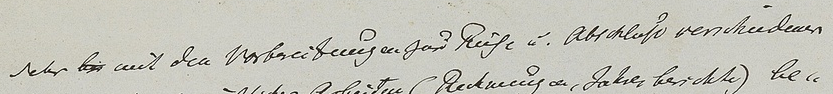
sehr bis mit den Vorbereitungen zur Reise u. Abschluss verschiedener
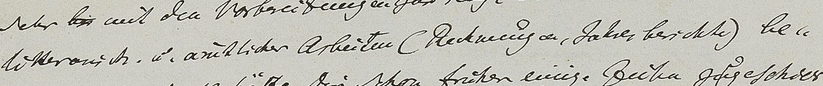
litterarisch. u. ammtlicher Arbeiten (Rechnungen, Jahresberichte) be-
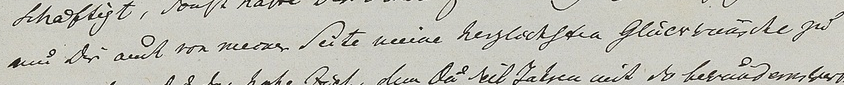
um Dir auch von meiner Seite meiner herzlichsten Glückwünsche zu
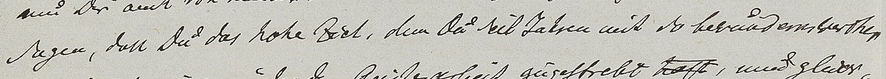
sagen, dass Du das hohe Ziel, dem Du seit Jahren mit so bewundernswerther
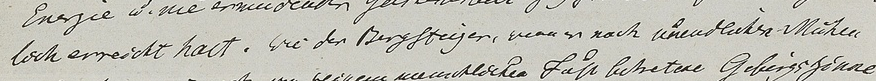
lich erreicht hast. Wie der Bergsteiger, wenn er nach unendlichen Mühen
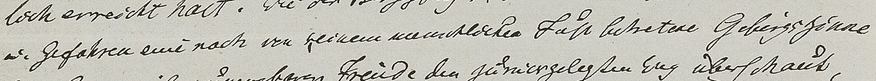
u. Gefahren eine noch von keinem menschlichen Fuss betretene Gebirgszinne
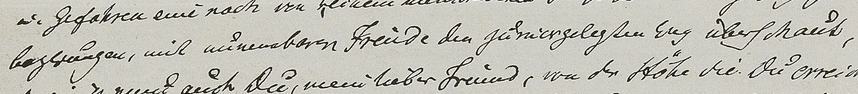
bezwungen, mit unnennbarer Freude den zurückgelegten Weg überschaut,
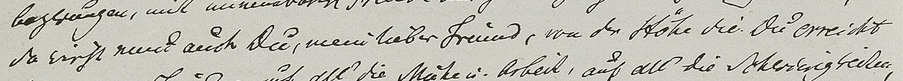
so wirst nun auch Du, mein lieber Freund, von der Höhe die Du erreicht
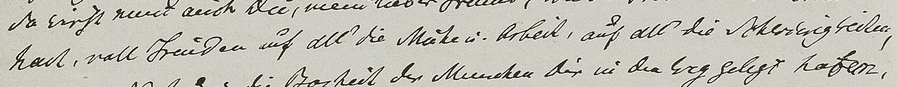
hast, voll Freuden auf all' die Mühe u. Arbeit, auf all' die Schwierigkeiten,
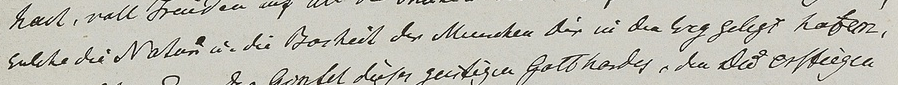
welche die Natur u. die Bosheit der Menschen Dir in den Weg gelegt haben,
